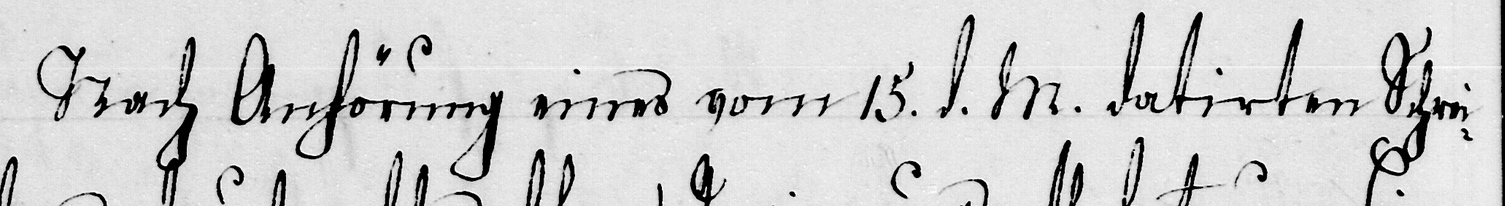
Nach Anhörung eines vom 15. d. M. datirten Schre¬
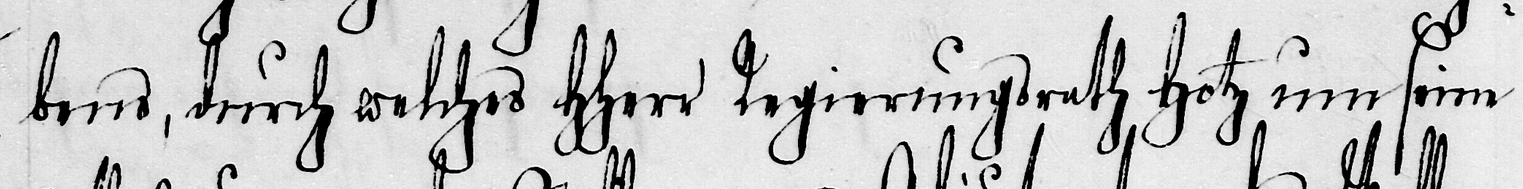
ibens, durch welches HHerr Regierungsrath Hotz um seine
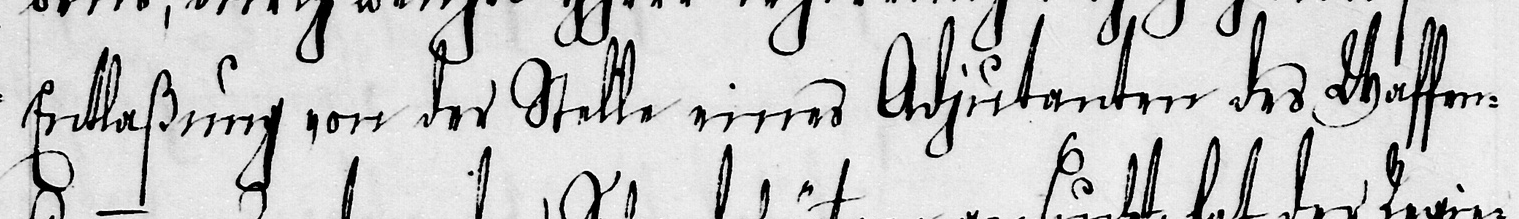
Entlaßung von der Stelle eines Adjutanten des Waffe¬
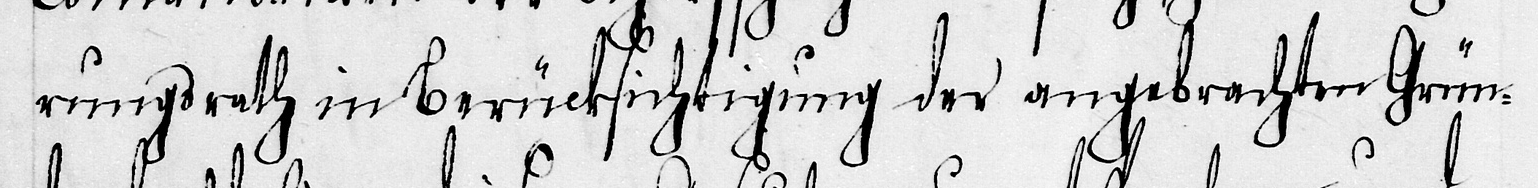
rungsrath in Berücksichtigung der angebrachten Grün¬
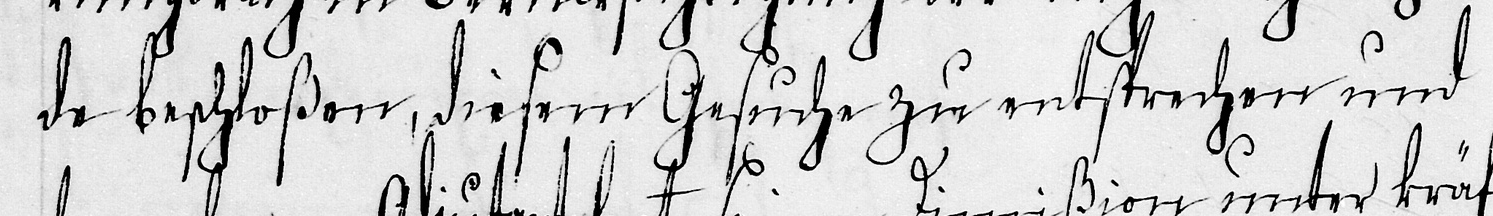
de beschloßen, diesem Gesuche zu entsprechen und
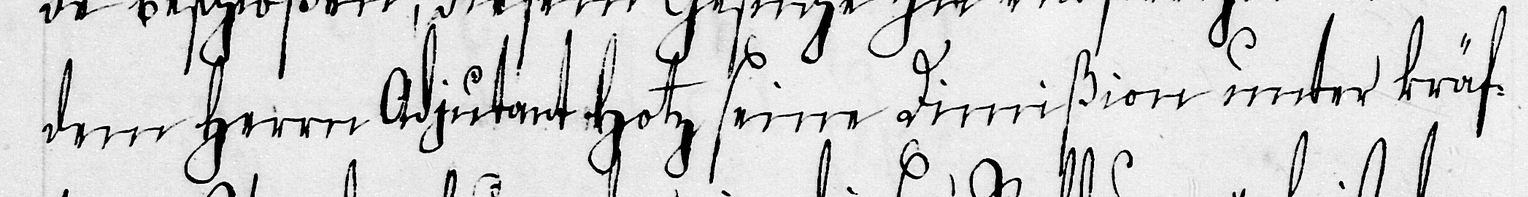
dem Herrn Adjutant Hotz seine Dimißion unter kräf¬
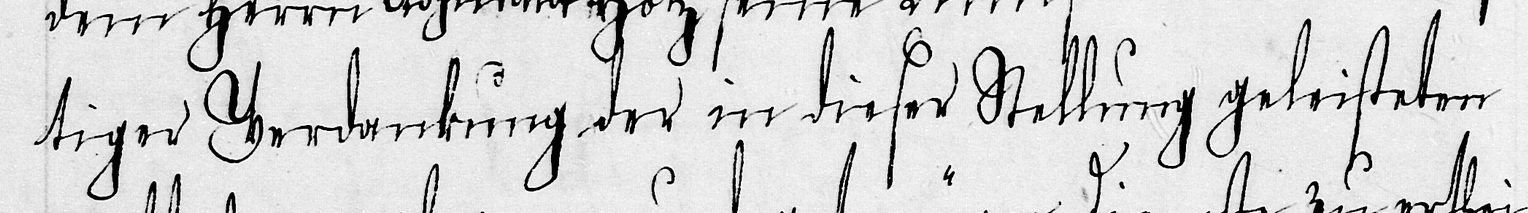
tiger Verdankung der in dieser Stellung geleisteten
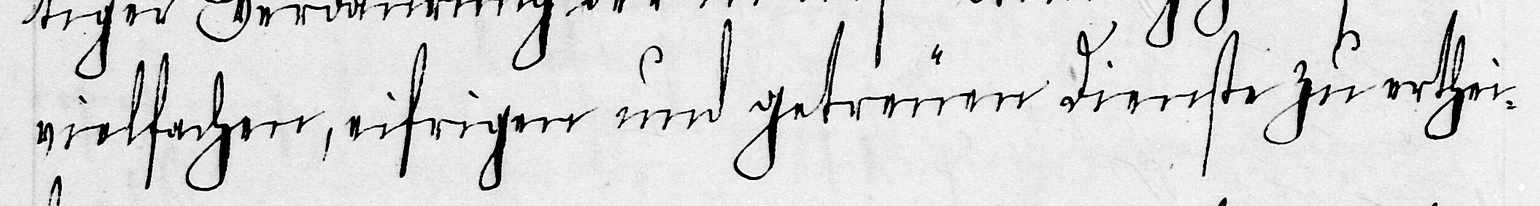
vielfachen, eifrigen und getreuen Dienste zu erthei¬
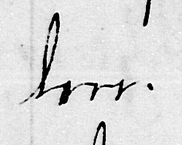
len.
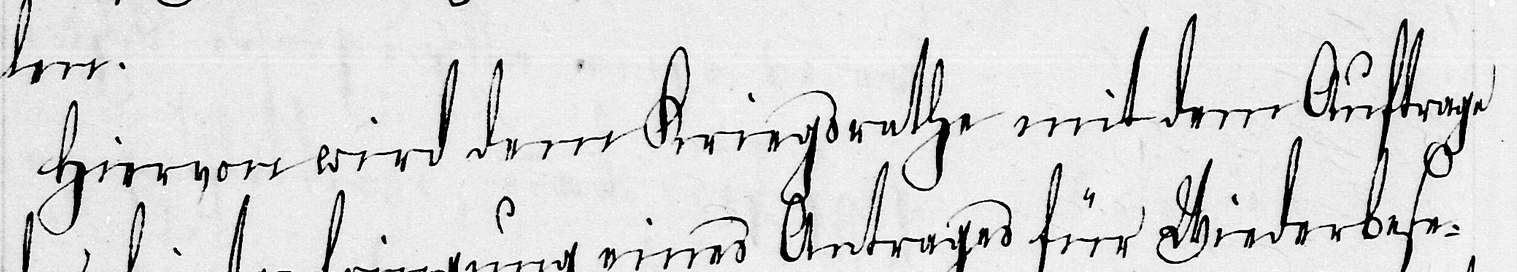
Hiervon wird dem Kriegsrathe mit dem Auftrage
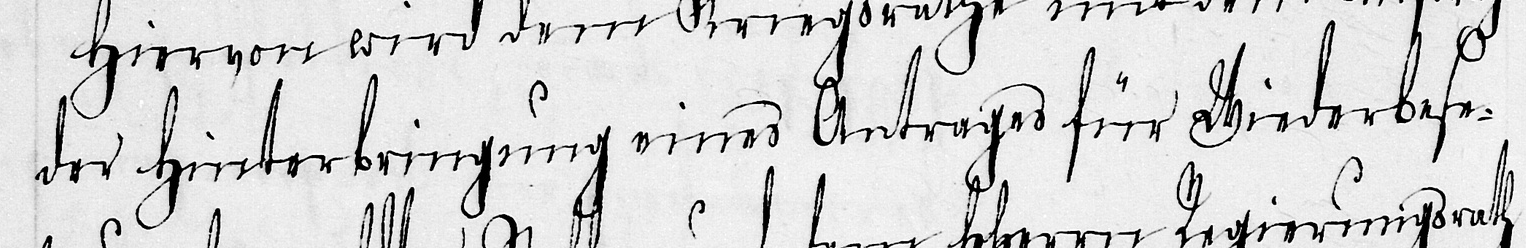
der Hinterbringung eines Antrages für Wiederbese¬
